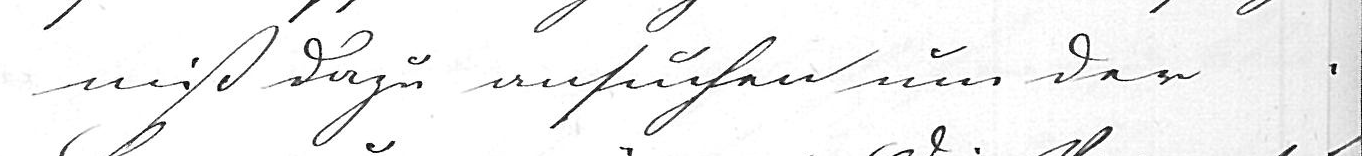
niß dazu ansuchen um der
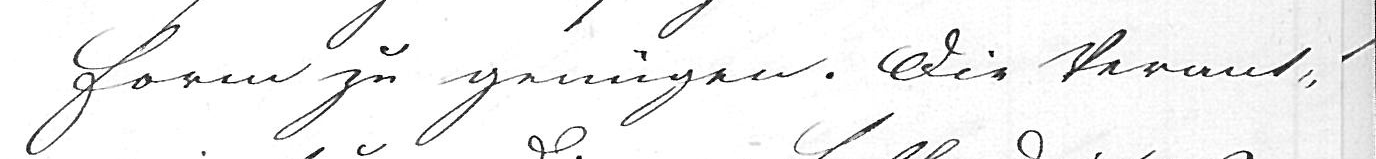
Form zu genügen. Die Verant-
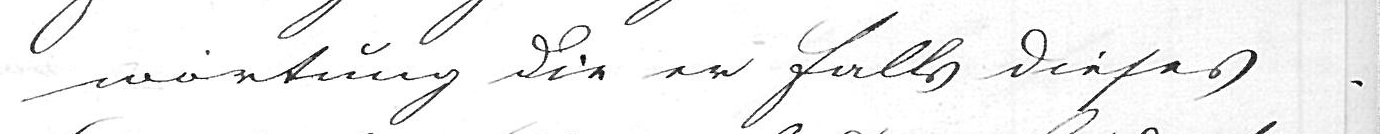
wortung die er falls dieses
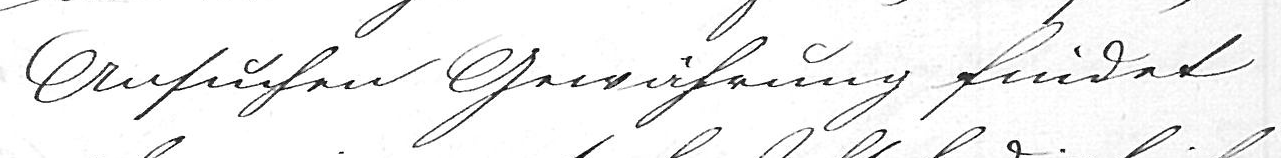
Ansuchen Gewährung findet
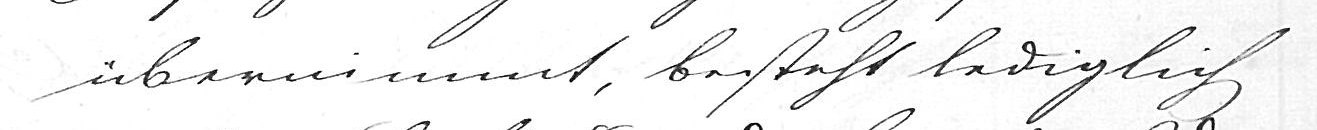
übernimmt, besteht lediglich
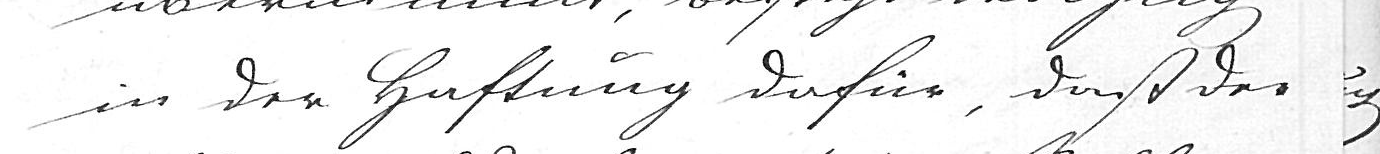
in der Haftung dafür, daß der
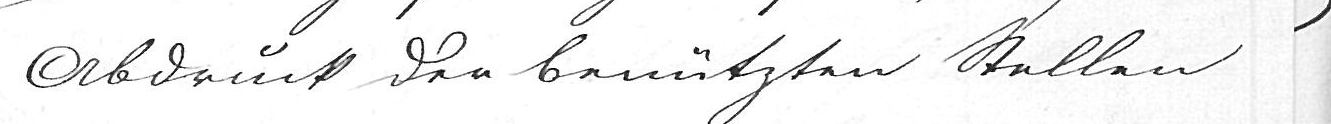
Abdruck der benützten Stellen
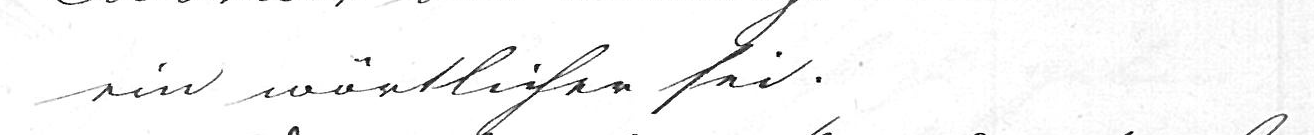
ein wörtlicher sei.
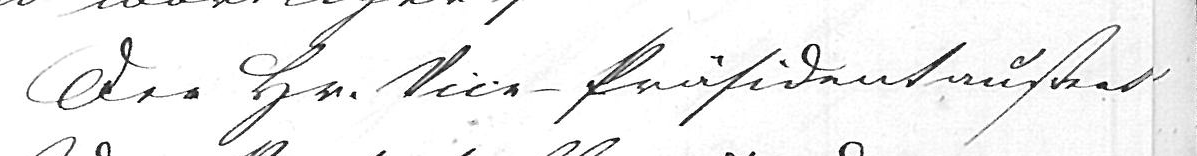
Der Hr. Vice-Präsident äußert
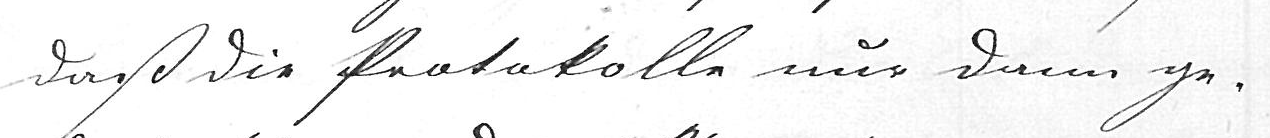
daß die Protokolle nur dann ge-
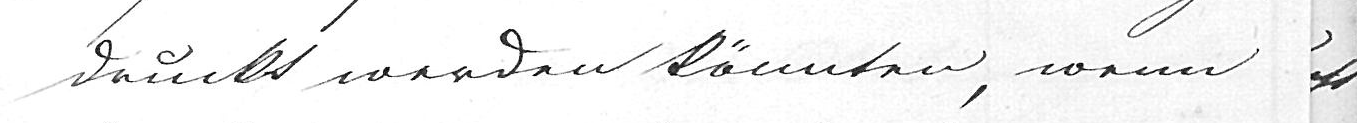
druckt werden könnten, wenn
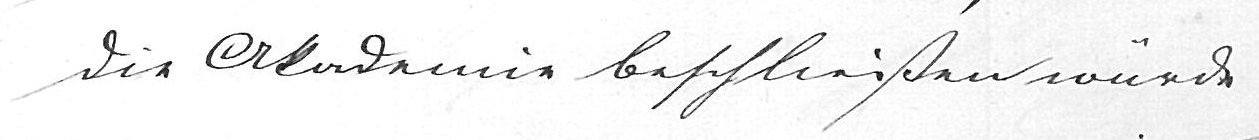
die Akademie beschließen würde
